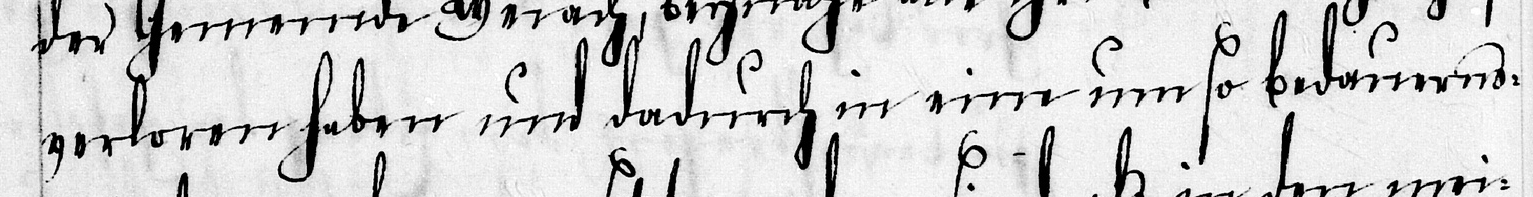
verloren haben und dadurch in eine um so bedauerns¬
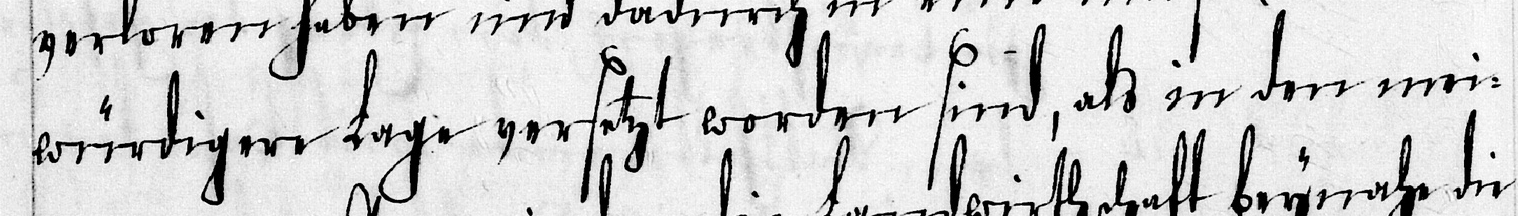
würdigere Lage versetzt worden sind, als in den mei¬
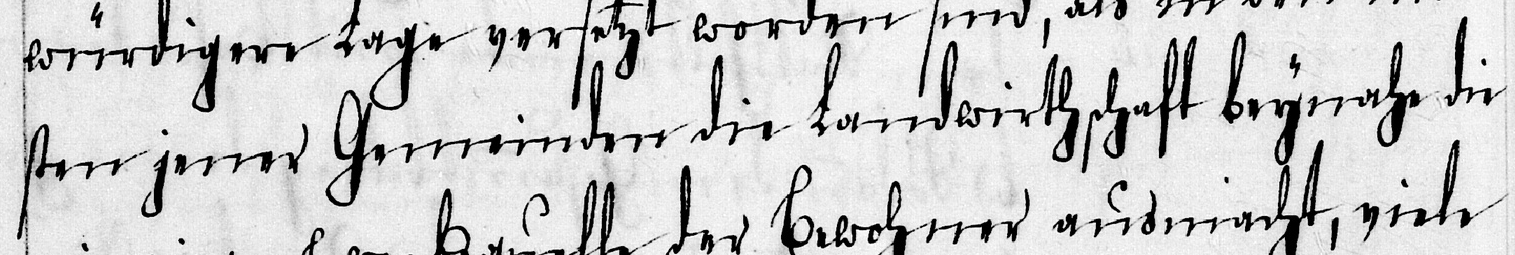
sten jener Gemeinden die Landwirthschaft beynahe die
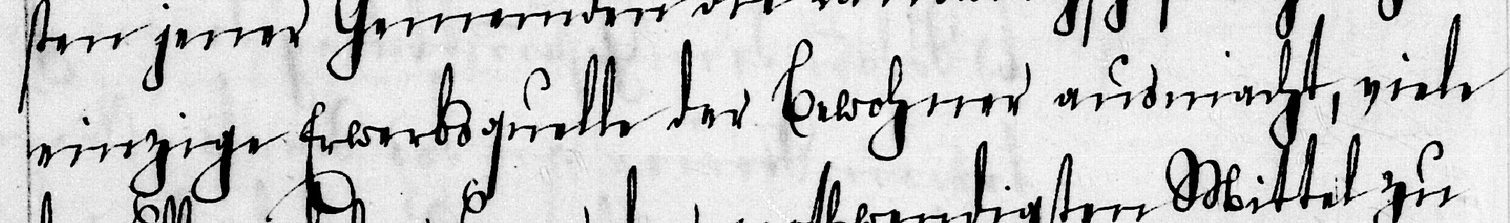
einzige Erwerbsquelle der Bewohner ausmacht, viele
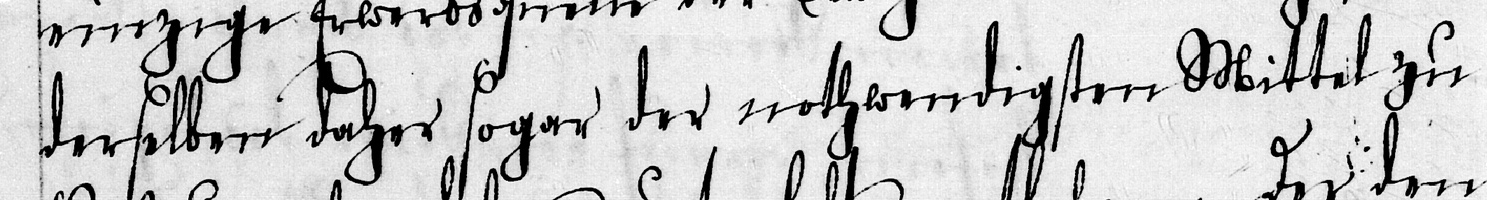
derselben daher sogar der nothwendigsten Mittel zu
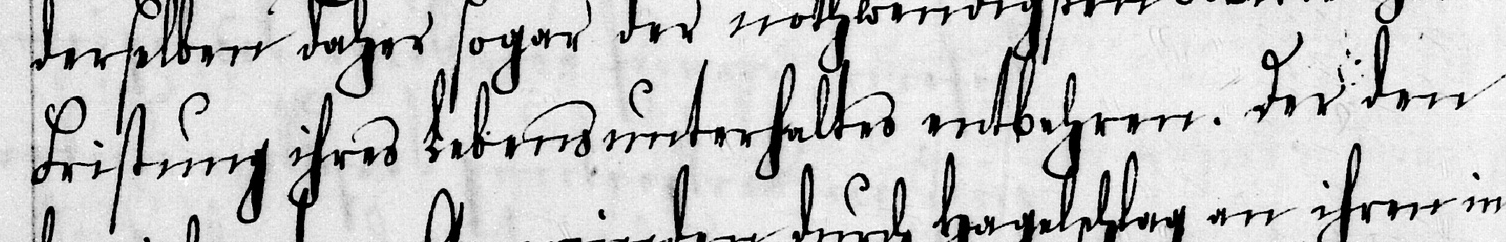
Fristung ihres Lebensunterhaltes entbehren. Der den
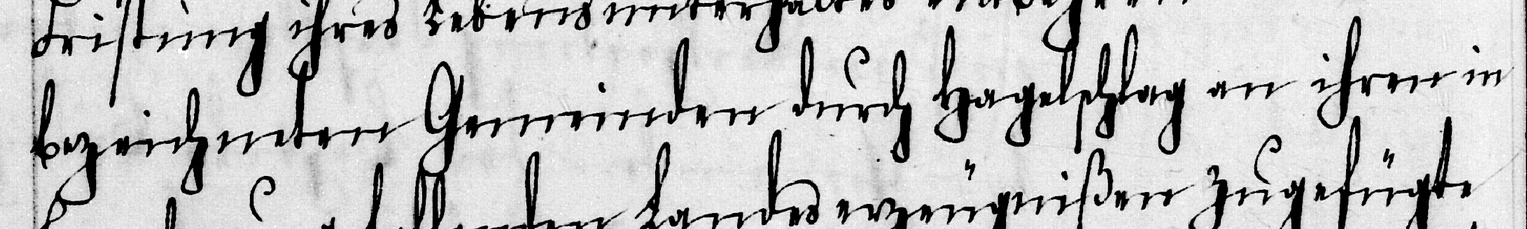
bezeichneten Gemeinden durch Hagelschlag an ihren in
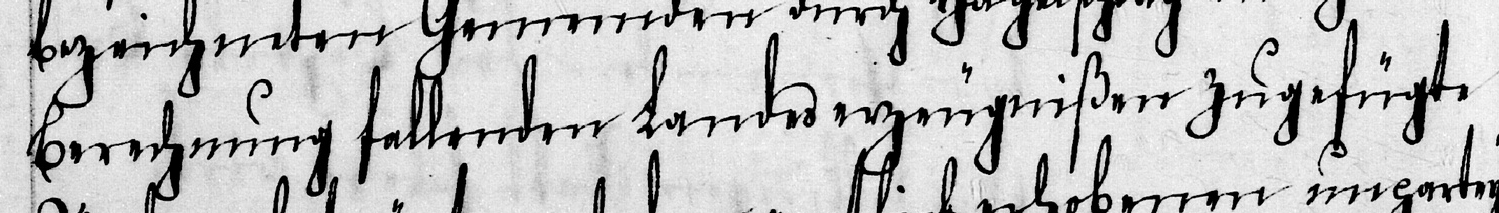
Berechnung fallenden Landeserzeugnißen zugefügte
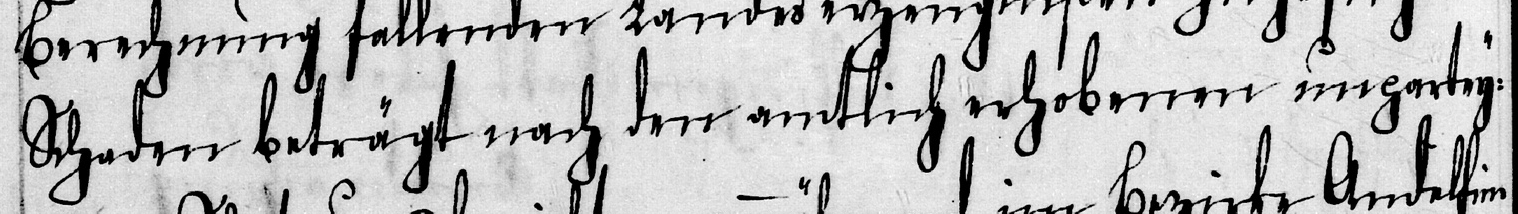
Schaden beträgt nach den amtlich erhobenen unpartey¬
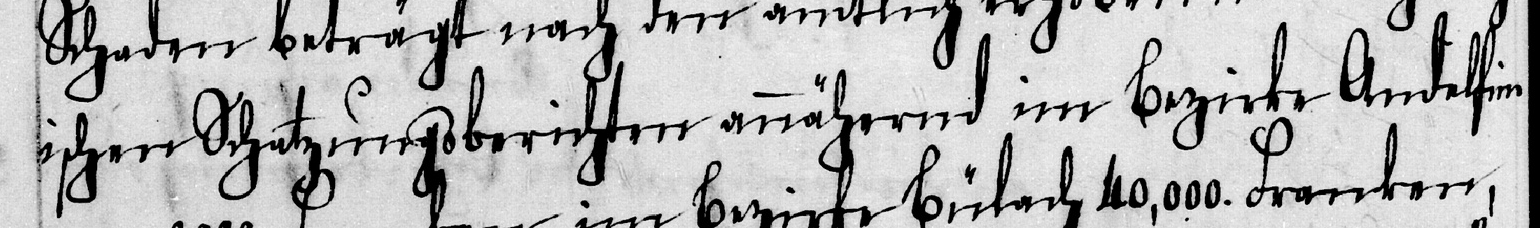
ischen Schatzungsberichten annähernd im Bezirke Andelfi¬
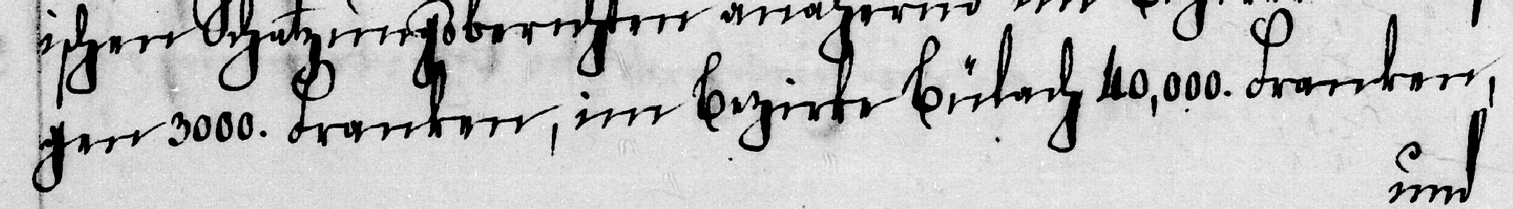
ngen 3000. Franken, im Bezirke Bülach 40'000. Franken,
